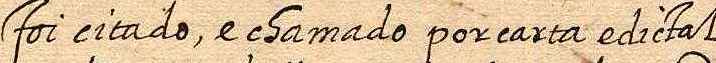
foi citado, e chamado por carta edictaL
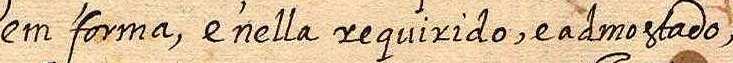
em forma, e nella requirido, e admoestado,
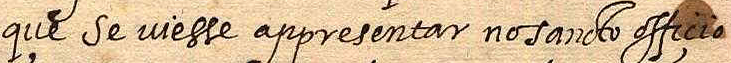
que se uiesse appresentar no sancto officio
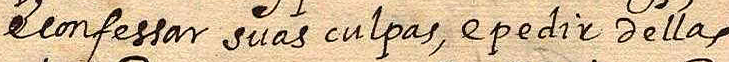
e confessar suas culpas, e pedir dellas
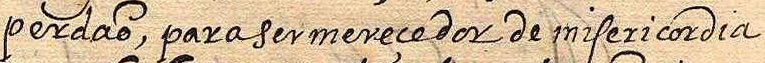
perdão, para ser merecedor de misericordia
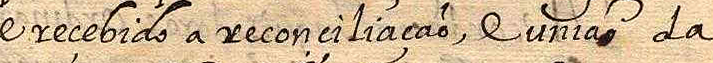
e recebido a reconciliaçaõ, e união da
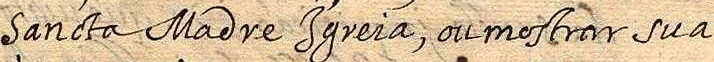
Sancta Madre Igreia, ou mostrar sua
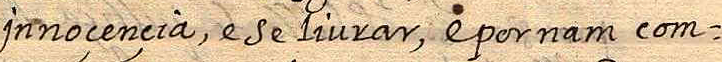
jnnocencia, e se liurar, e por nam com
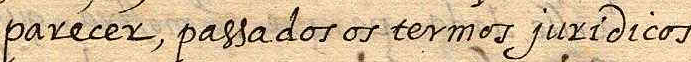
parecer, passados os termos juridicos
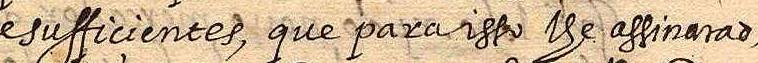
e sufficientes, que para isso lhe assinarão,
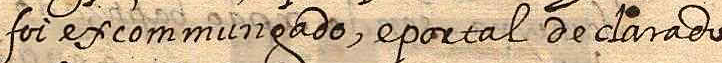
foi excommungado, e por tal declarado
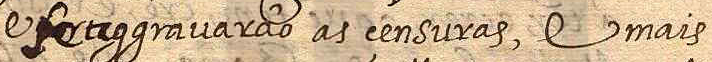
e _aggrauarão as censuras, e mais
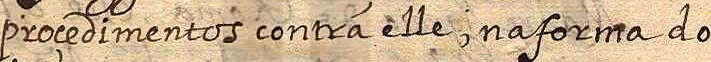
procedimentos contra elle, na forma do
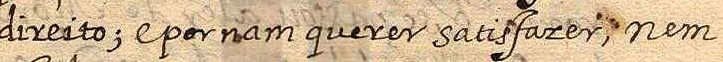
direito, e por nam querer satisfazer, nem
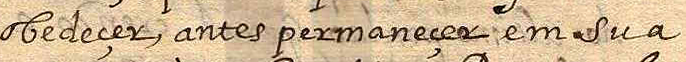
obedecer, antes permanecer em sua
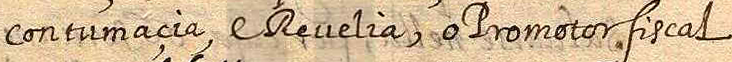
contumacia, e Reuelia, o Promotor FiscaL
